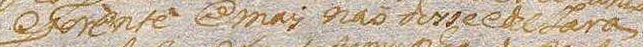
e parente e mais naõ disse e decLara
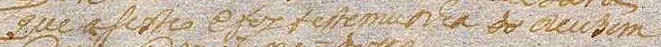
que asiste e fez testemunha do Recebim
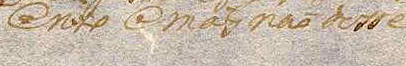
Ento e mais naõ disse
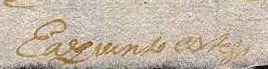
E ao quinto artigo
